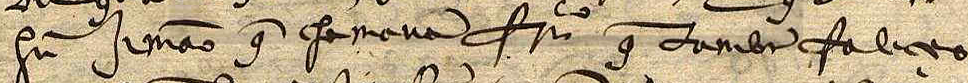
hū Jrmão q̄ chamauā frco q̄ tambē faleceo
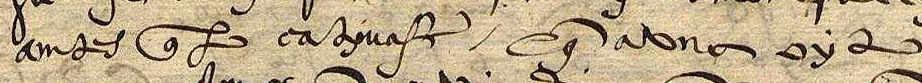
amtes q̄ ho catyuasē / e q̄ avera oyto
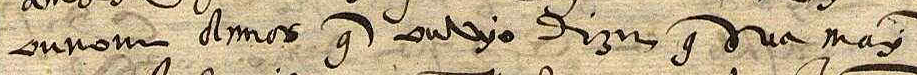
ou noue Annos q̄ ouvyo dizer q̄ sua maỹ
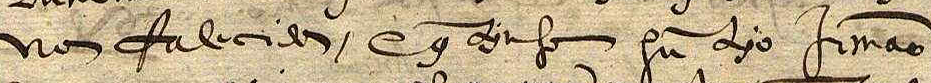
era falecida / e q̄ tynha hū tyo Jrmão
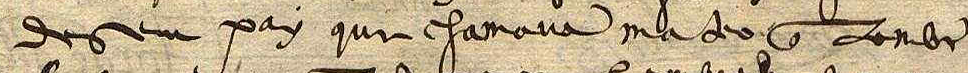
de seu pay que chamauā mateo q̄ tambē
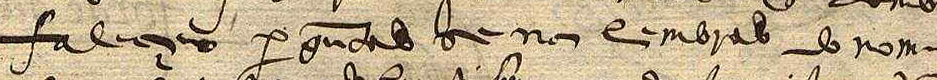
faleceo ꝑgūtado se era lembrado do nome
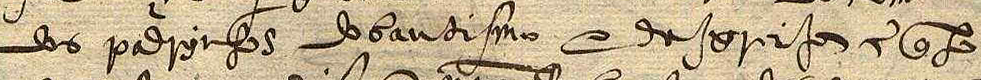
dos padrynhos do bautismo e da JgreiJa ē q̄ ho
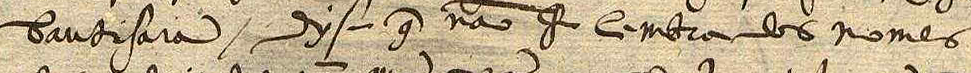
bautisarā / dyse q̄ não lhe lembra dos nomes
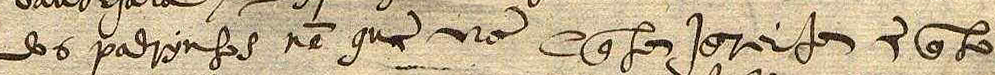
dos padrinhos nē quē erā e q̄ ha JgreiJa ē q̄ ho
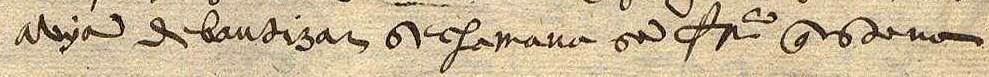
avyā de bautizar se chamaua sā frco q̄ estaua
